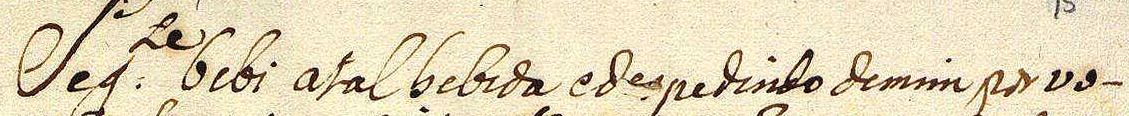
Seg.te bebi a tal bebida e de_pedindo de mim por vo
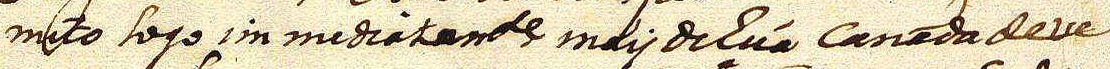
mito logo immediatamte mais de huā canada de ve
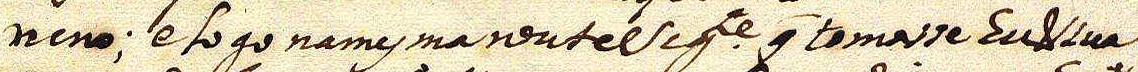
neno; e logo na mesma noute seg.te q̄ tomasse hū sua
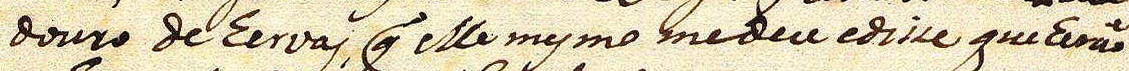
douro de hervas, q̄ elle mesmo me deu, e disse que heraõ
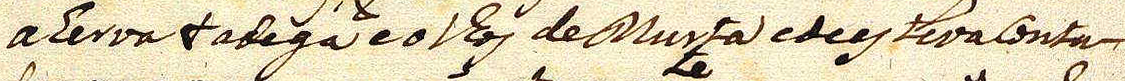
a herva tadega e olhos de Murta e de as ter a conta
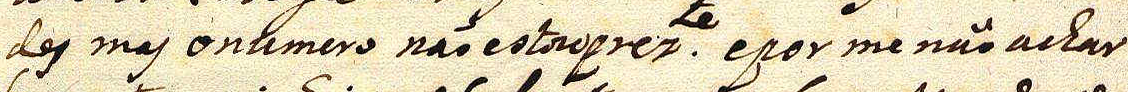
dos mas o numero naõ estou prez.te e por me não achar
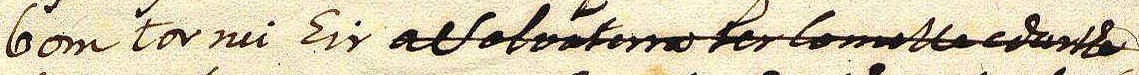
bom tornei hir a Salvaterra ter Com elle e darlhe
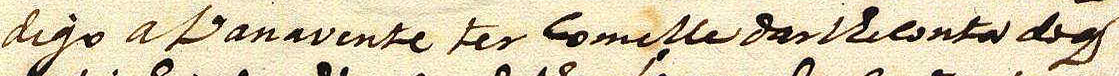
digo a Vanavente ter com elle darlhe conta do q̄
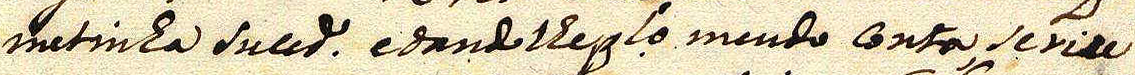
metinha suced.o e dandolhe plo meudo conta, se riu
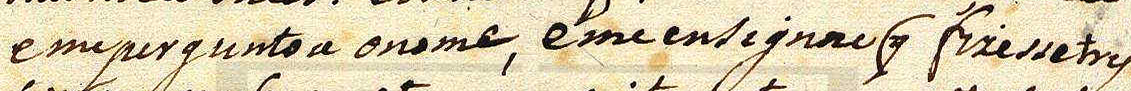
e me perguntou o nome, e me ensignou q̄ fizesse tres
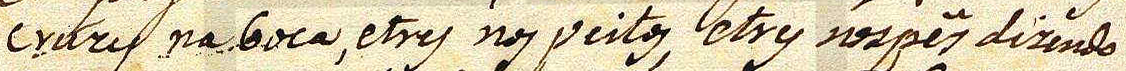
cruzes na boca, e tres nos peitos, e tres nos pés dizendo
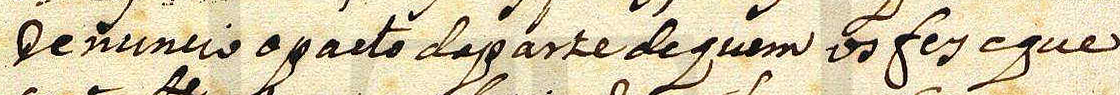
denuncio o pacto da parte de quem os fes e que
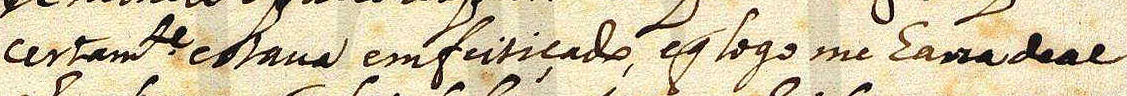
certam.te estaua emfeitiçado, e q̄ logo me havia de ac
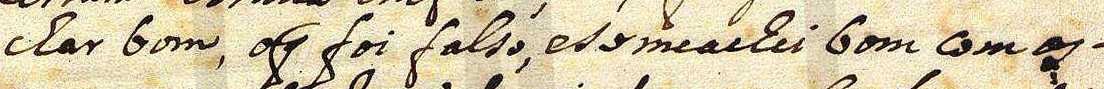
char bom, o q̄ foi falso, e so me achei bom com os
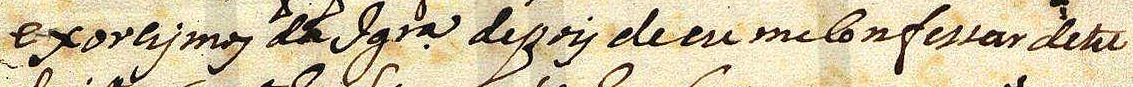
exorcismos da Igr.a depois de eu me confessar de tu
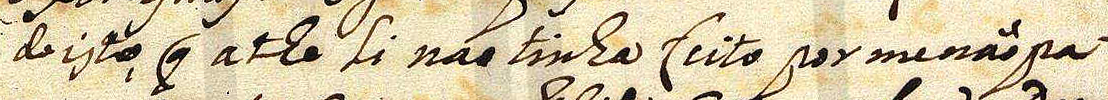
do isto, q̄ athe li naõ tinha feito por me naõ pa
